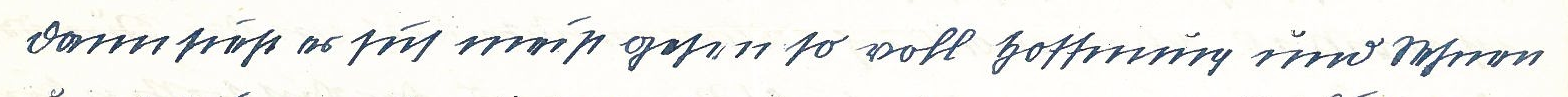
dann sieht er sich meist gehen so voll Hoffnung und Sehnen
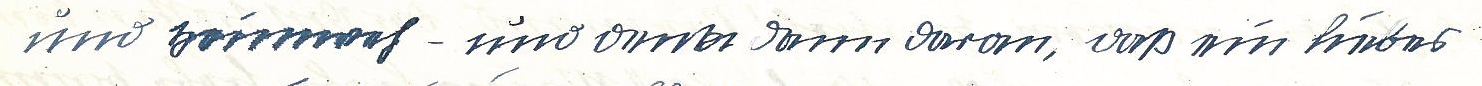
und Heimweh – und denke dann daran, daß ein liebes
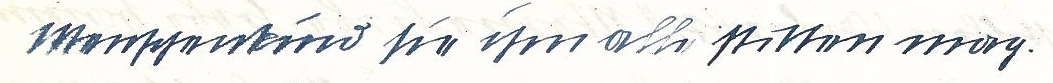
Menschenkind sie ihm alle stillen mag.
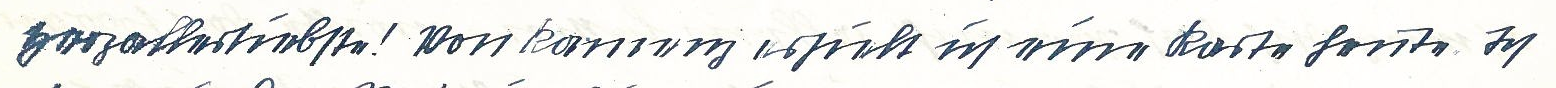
Herzallerliebste! Von K. erhielt ich eine Karte heute Ich
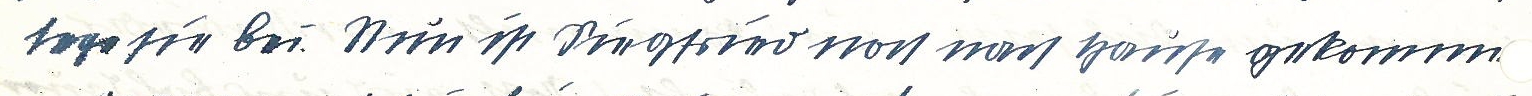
lege sie bei. Nun ist S. noch nach Hause gekomm
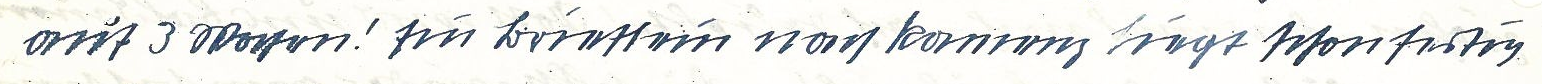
auf 3 Wochen! Ein Brieflein nach K. liegt schon fertig
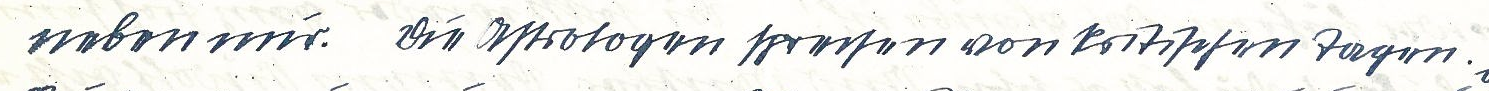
neben mir. Die Astrologen sprechen von kritischen Tagen.
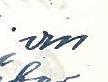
an
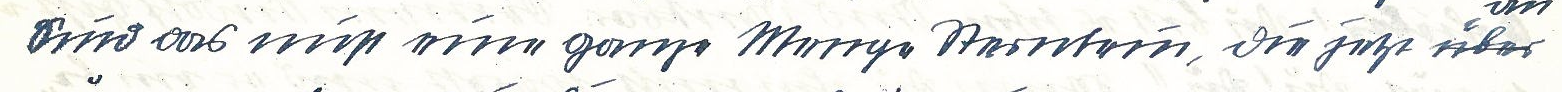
Sind das nicht eine ganze Menge Sternlein, die jetzt über
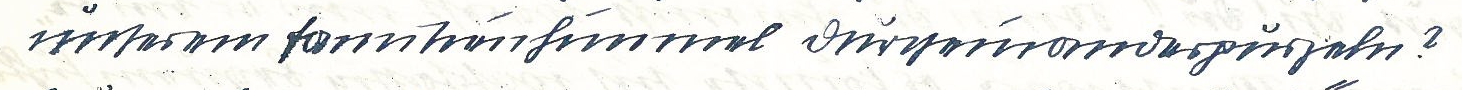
unserem Familienhimmel durcheinanderpurzeln?
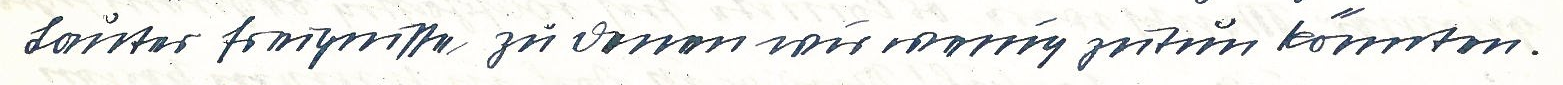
Lauter Ereignisse, zu denen wir wenig zutun könnten.
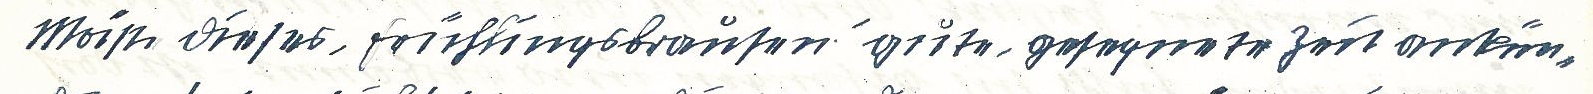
Möchte dieses ‚Frühlingsbrausen´ gute, gesegnete Zeit ankün¬
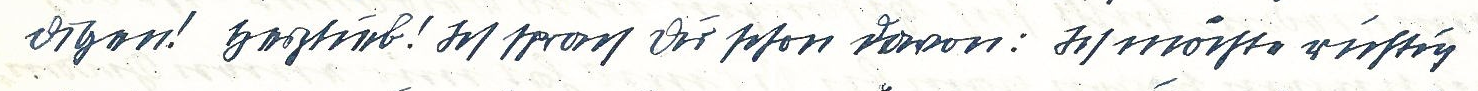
digen! Herzlieb! Ich sprach Dir schon davon: Ich möchte richtig
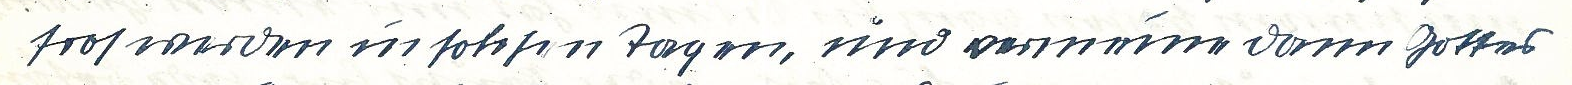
froh werden in solchen Tagen, und vermeine dann Gottes
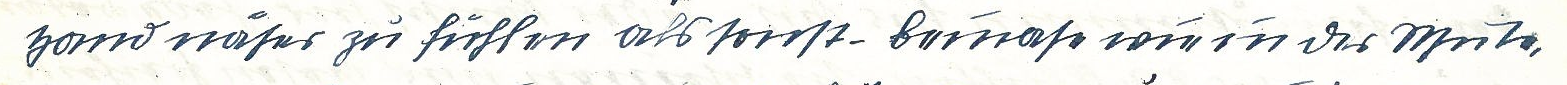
Hand näher zu fühlen als sonst. Beinahe wie in der Schule,
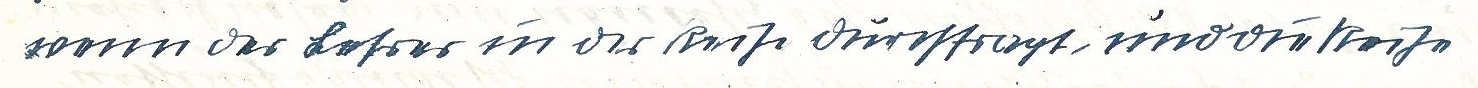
wenn der Lehrer in der Reihe durchfragt, und die Reihe
